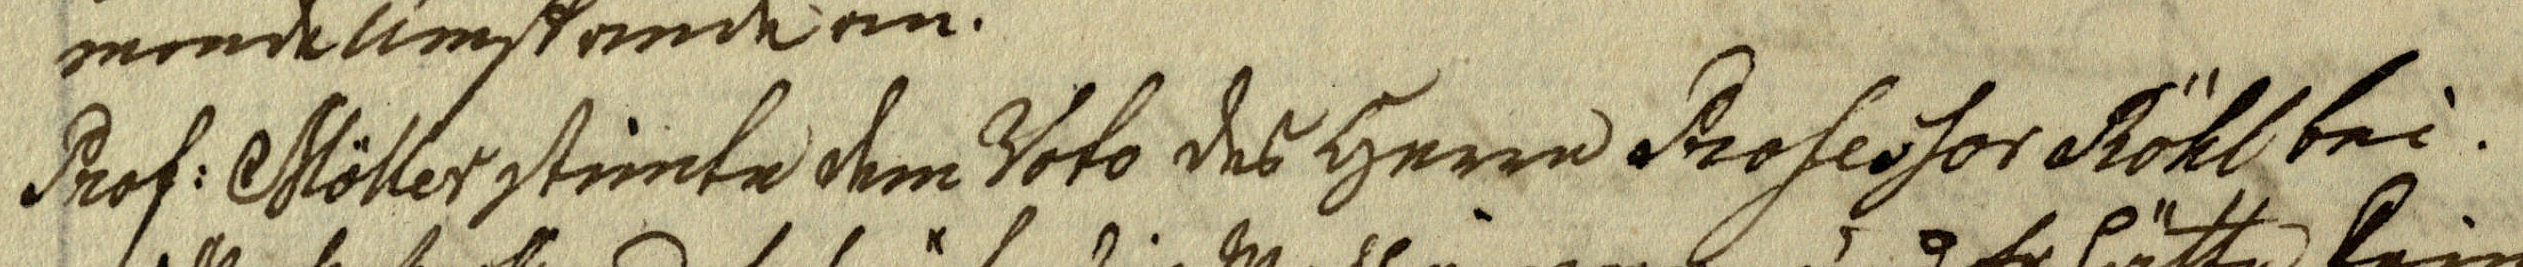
dh Prof. Möller stimte dem Voto des Herrn Professor Röhl bei.
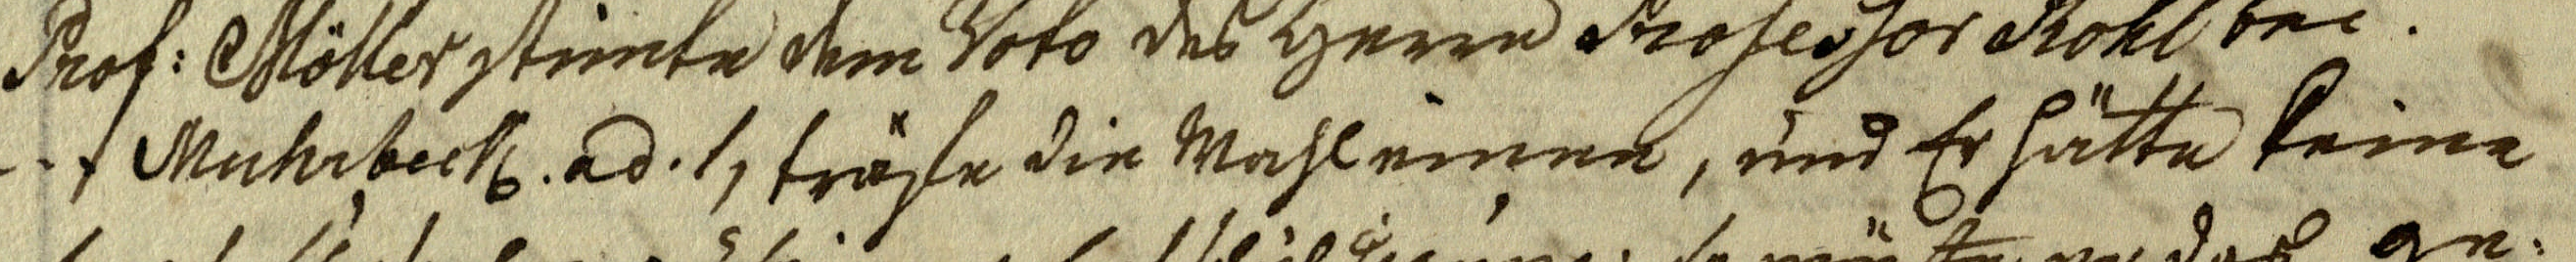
Muhrbeck. ad 1, träfe die Wahl einen, und Er hätte keine
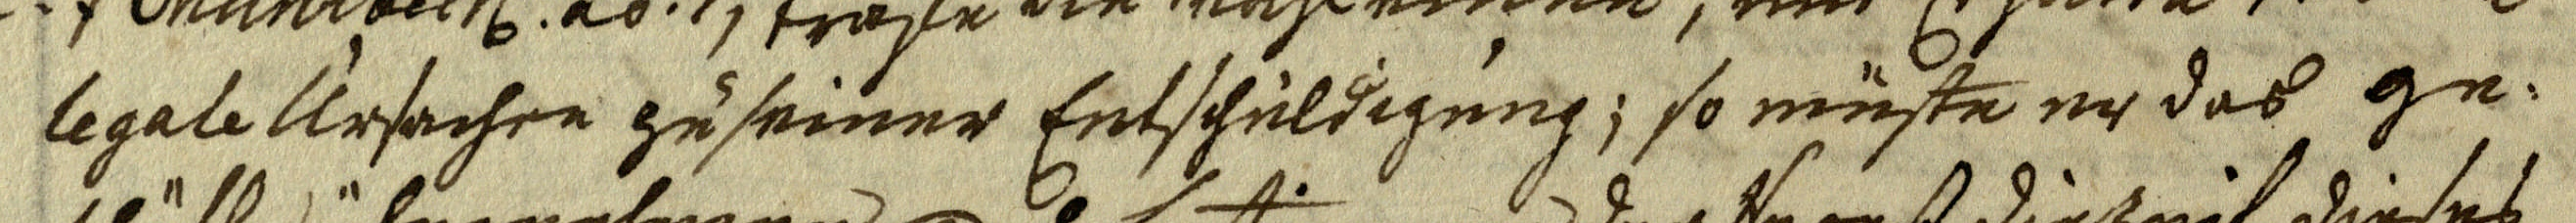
legale Ursachen zu seiner Entschuldigung, so müste er das Ge¬
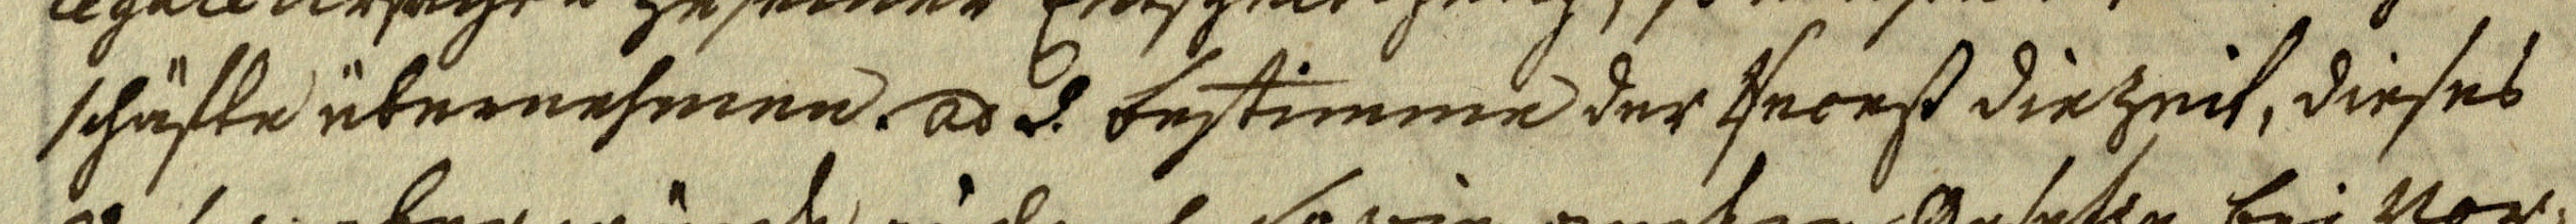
schäfte übernehmen. ad. 2. bestimme der Receß die Zeit, dieses
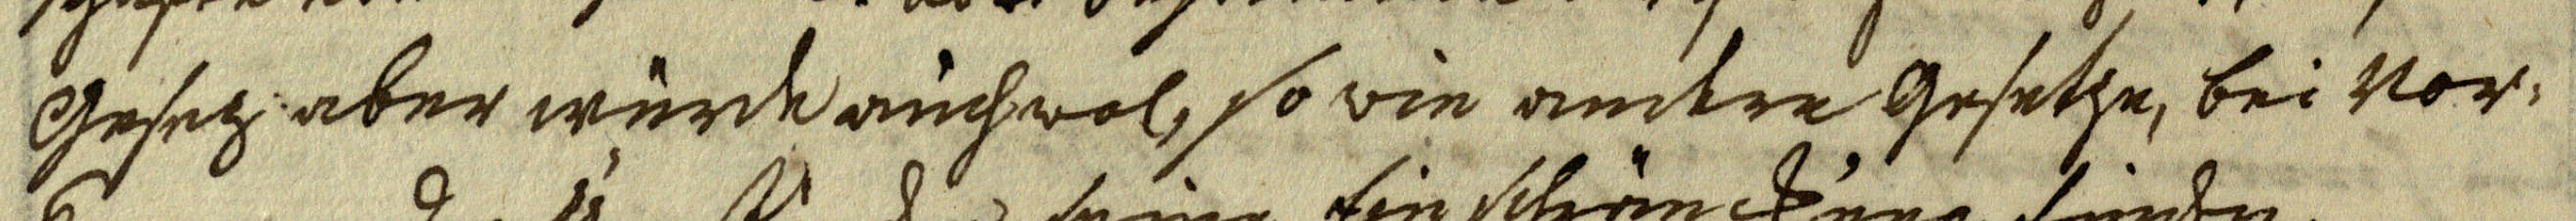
Gesez aber würde auch wol, so wie andere Gesetze, bei vor¬
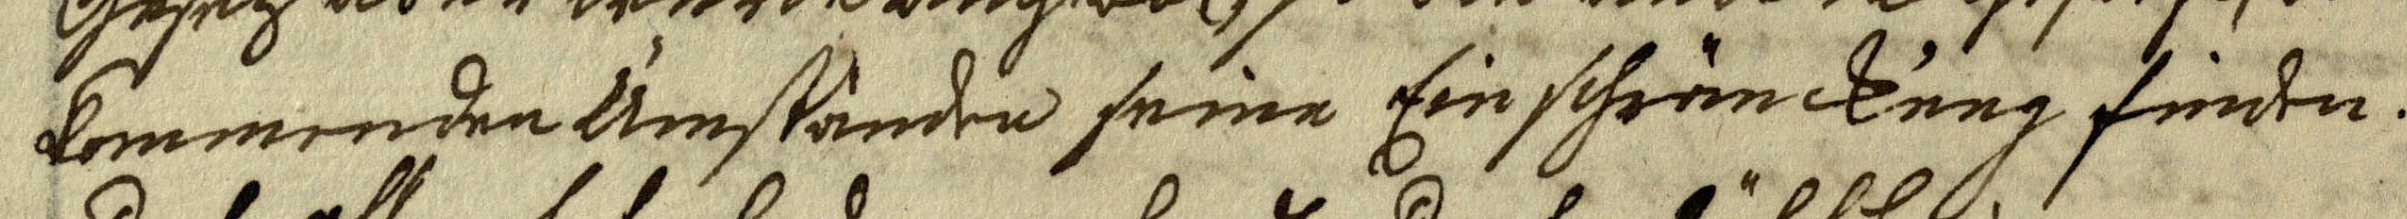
kommenden Umständen seine Einschränckung finden.
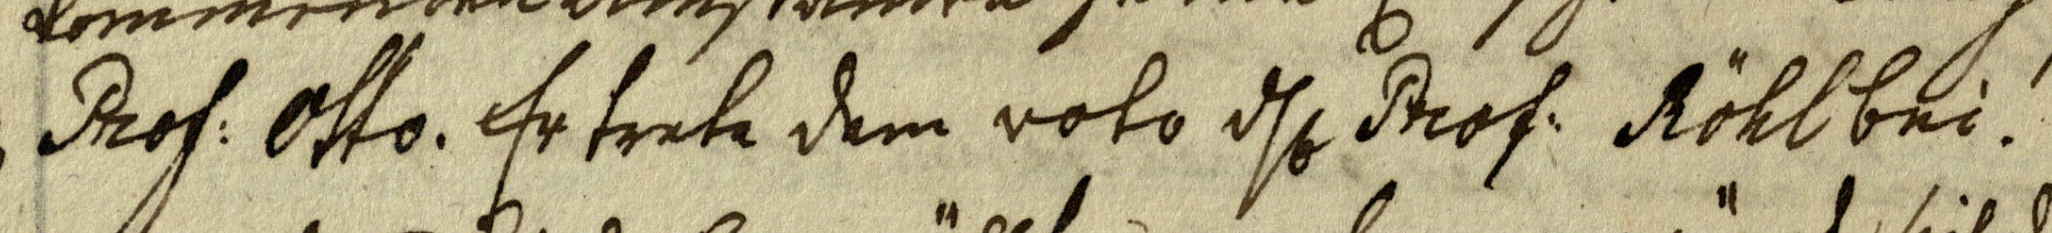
dh Prof. Otto. Er trete dem voto dh Prof. Röhl bei.
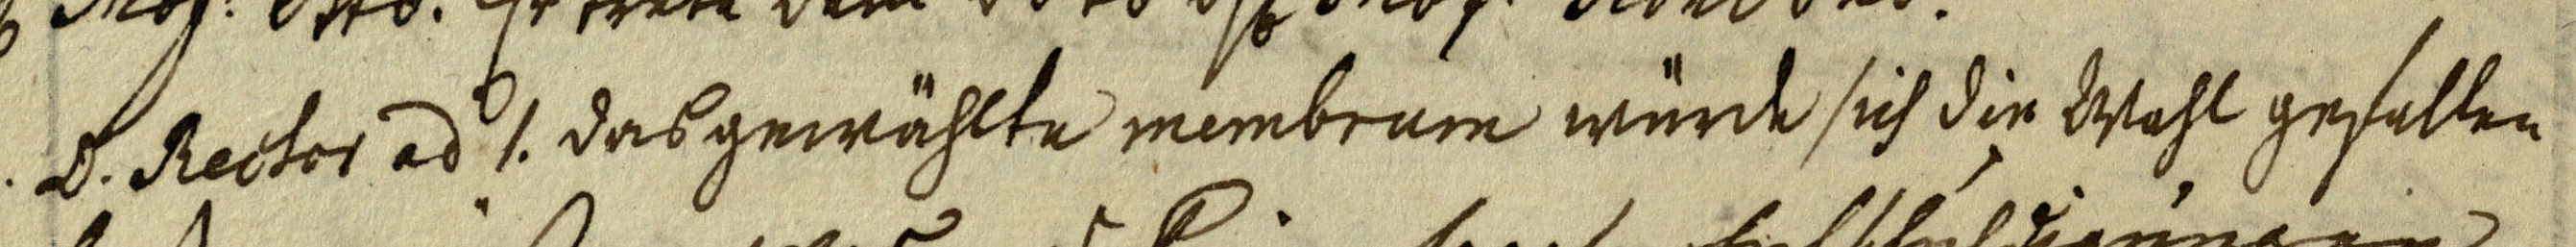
M. D. Rector ad 1. das gewählte membrum würde sich die Wahl gefallen
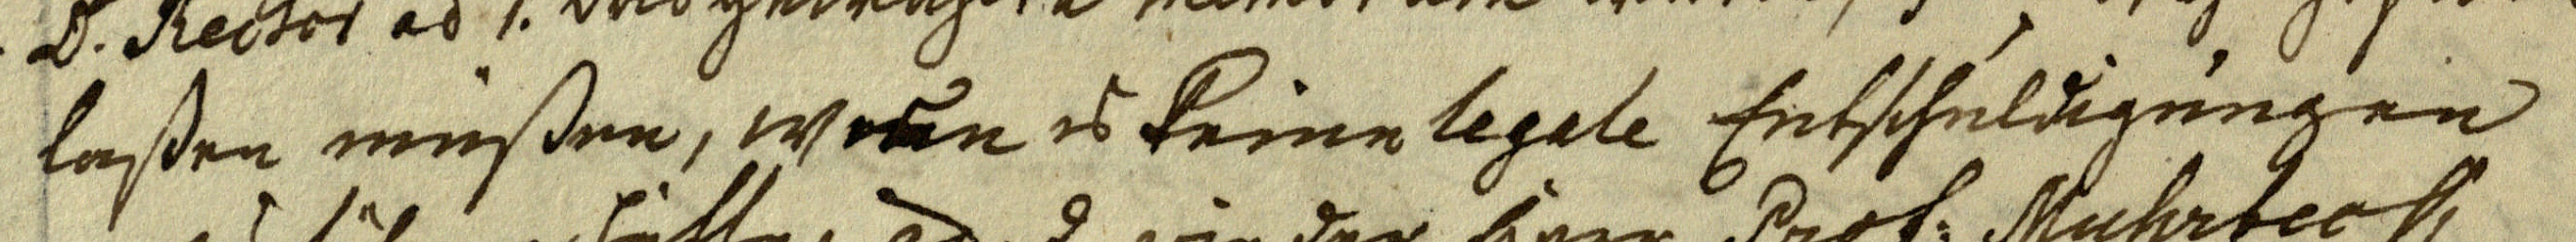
laßen müßen, wenn es keine legale Entschuldigungen
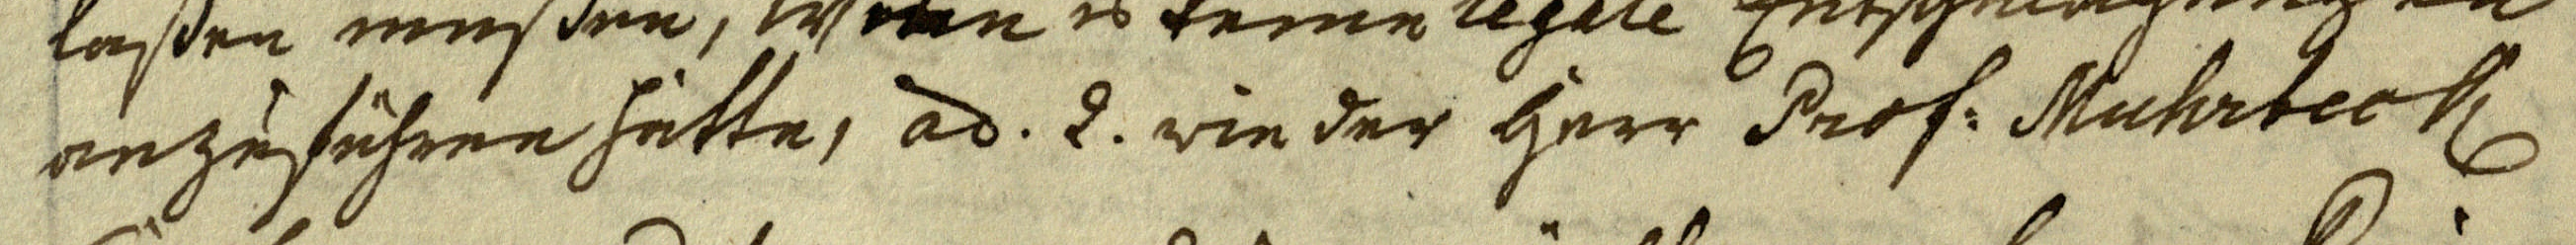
anzuführen hätte, ad 2. wie der Herr Prof. Muhrbeck
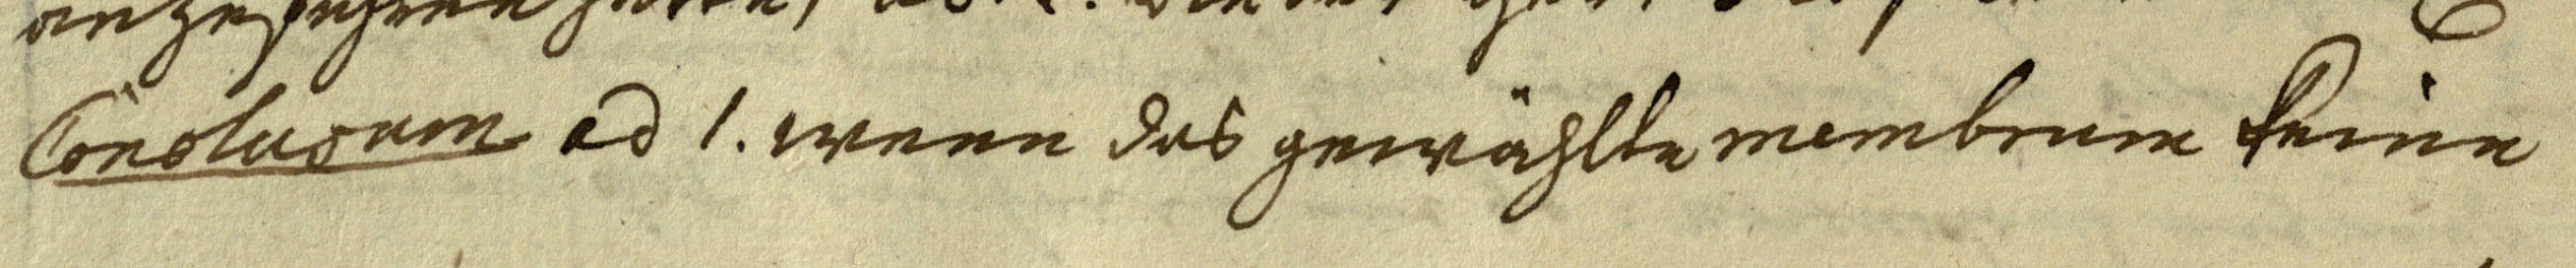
Conclusum ad 1. wenn das gewählte membrum keine
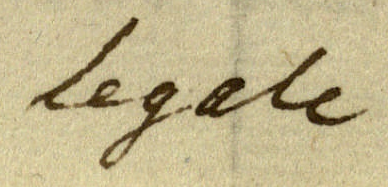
legale
